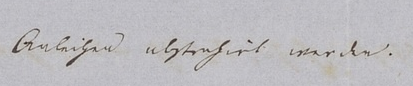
Anleihen abstrahirt werden.
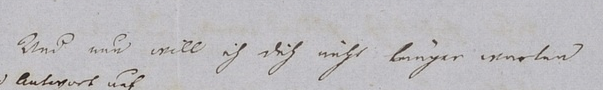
Und nun will ich Dich nicht länger warten
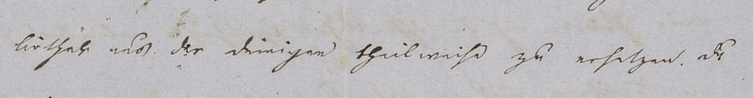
liothek aus der Deinigen theilweise zu ersetzen. Du
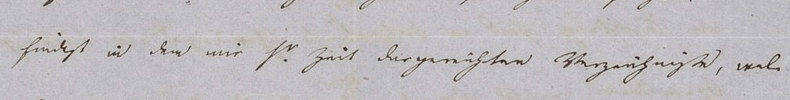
findest in dem mir sr Zeit dargereichten Verzeichnisse, wel-
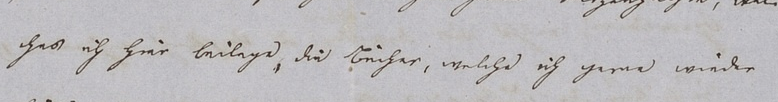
ches ich hier beilege, die Bücher, welche ich gerne wieder
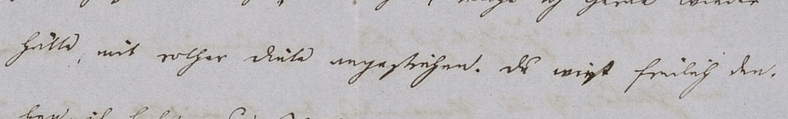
hätte, mit rother Dinte angestrichen. Du wirst freilich den-
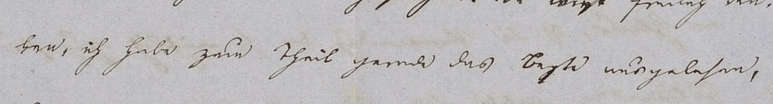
ken, ich habe zum Theil gerade das Beste ausgelesen,
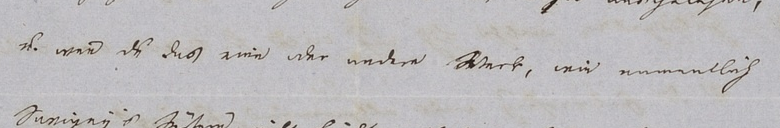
u. wenn Du das eine oder andre Werk, wie namentlich
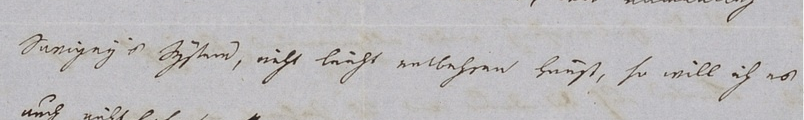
Savigny's System, nicht leicht entbehren kannst, so will ich es
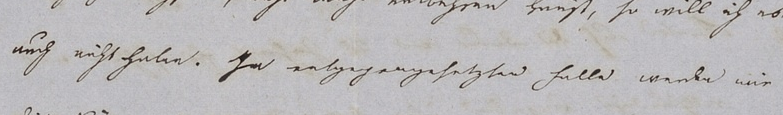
auch nicht haben. Im entgegengesetzten Falle werden mir
